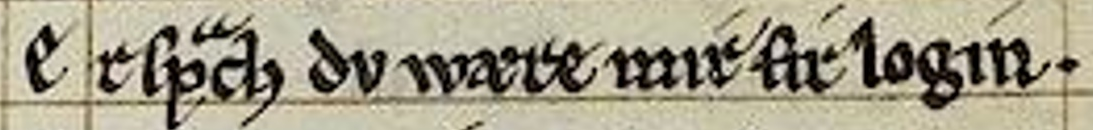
Er sp(ra)ch dv w[ae]re mir fir login.
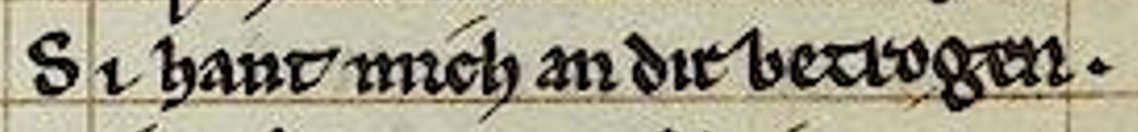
Si hant mich an dir betrogen.
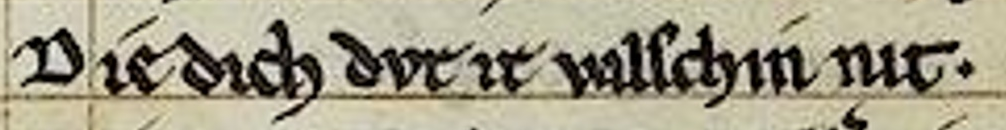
Die dich dvr ir valſchin nit.
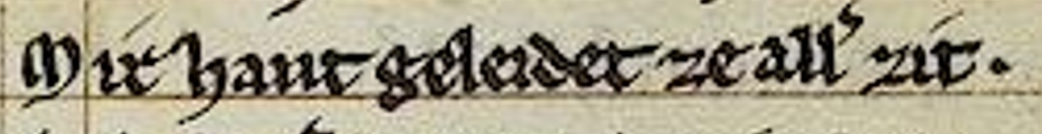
Mir hant geleidet ze all(er) zit.
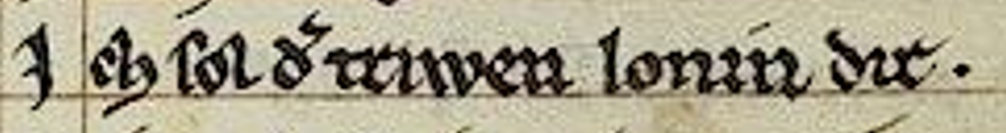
Ich ſol (der) triwen lonin dir.
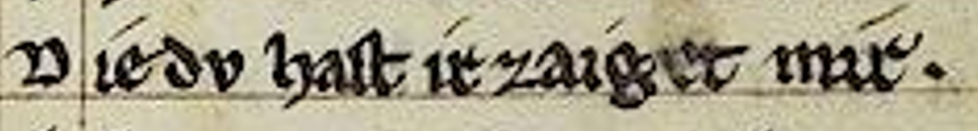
Die dv haſt ir zaiget mir.
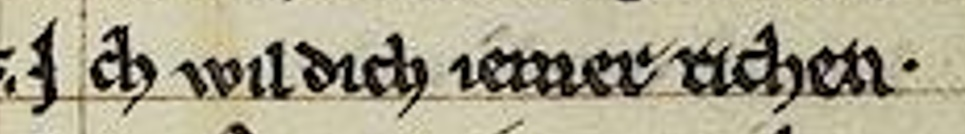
Ich wil dich iemer richen.
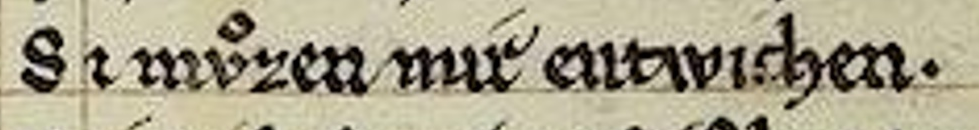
Si mv°ozen mir entwichen.
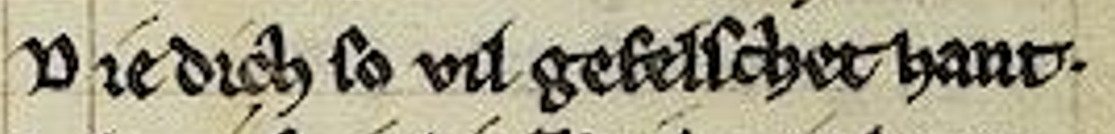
Die dich ſo vil gefelſchet hant.
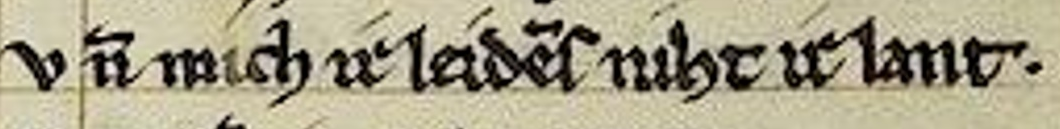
Vn(d) mich ir leide(n)ſ niht ir lant.
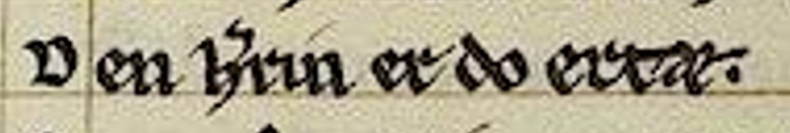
Den h(er)rin er do ert[ae].
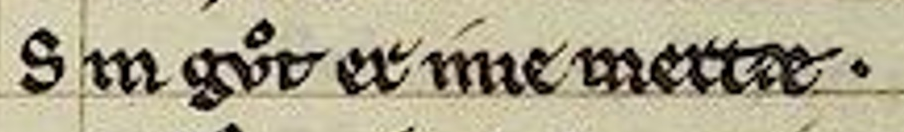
Sin gv°ot er ime mert[ae].
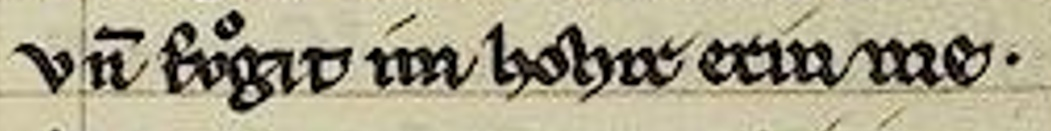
Vn(d) fv°ogit im hohir erin me.
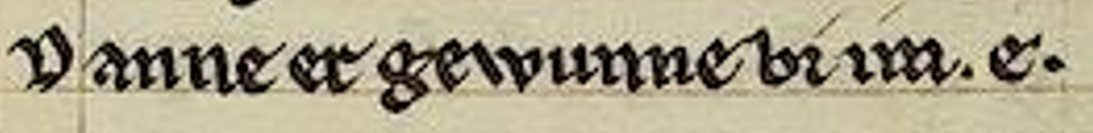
Danne er gewunne bi im. e.
